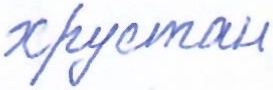хрустан
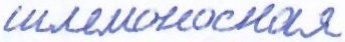шлемоносная
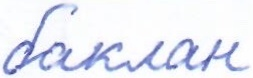баклан
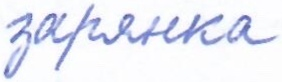зарянка
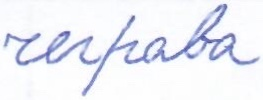чеграва
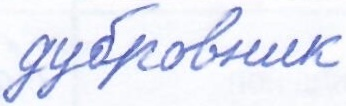дубровник
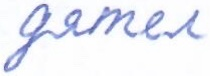дятел
